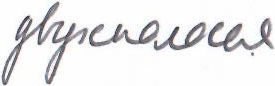двухполосая
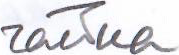чайка
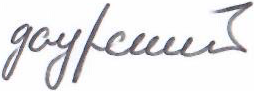даурский
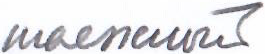таежный
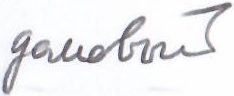домовый
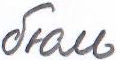бюль
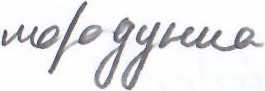мородунка
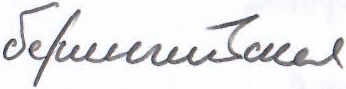берингийская
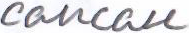сапсан
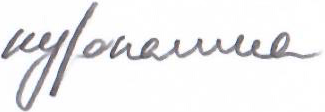куропатка
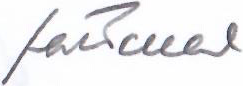райская
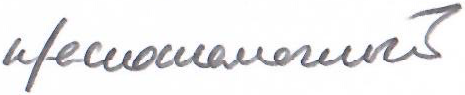красношапочный
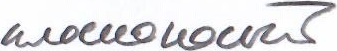плосконосый
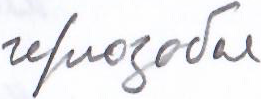чернозобая
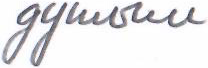дутыш
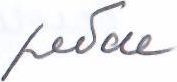рябок
